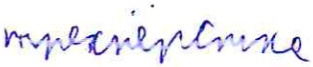трехпёрстка
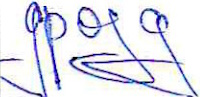дрозд
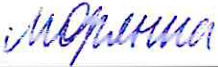морянка
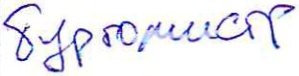бургомистр
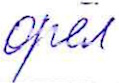орёл
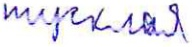тусклая
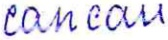сапсан
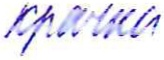крачка
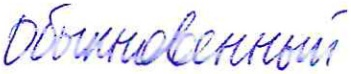обыкновенный
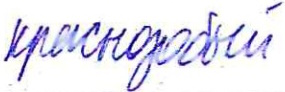краснозобый
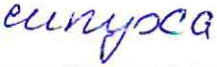сипуха
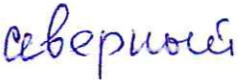северный
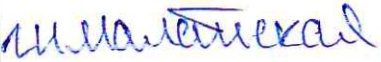гималайская
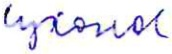сухонос
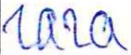гага
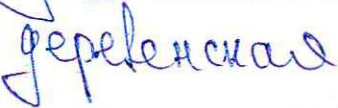деревенская
